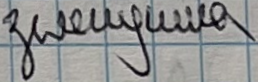зеленушка
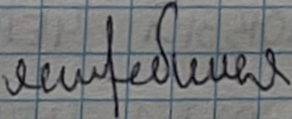ястребиная
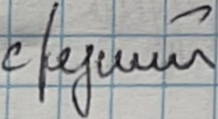средний
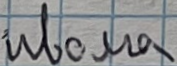иволга
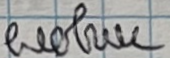еловик
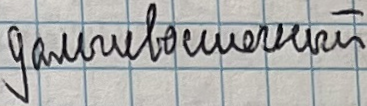дальневосточный
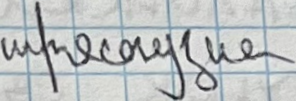трясогузка
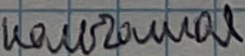кольчатая
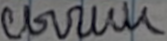сычик
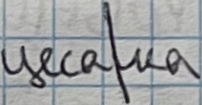цесарка
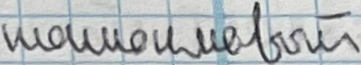тонкоклювый
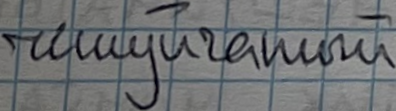чешуйчатый
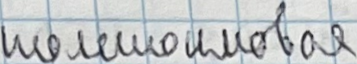толстоклювая
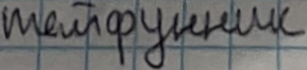тайфунник
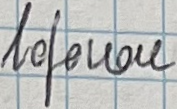воронок
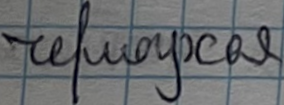черноухая
